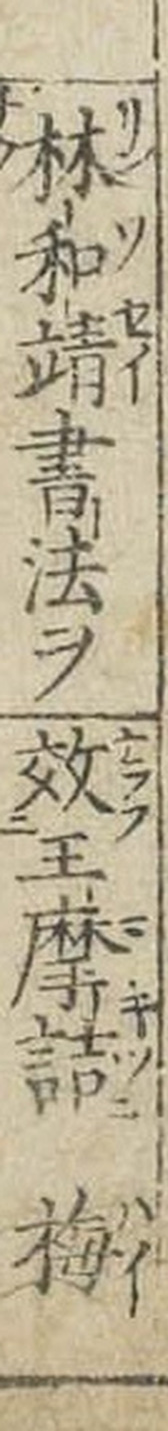林-和-靖書-法ヲ効王-摩-詰梅
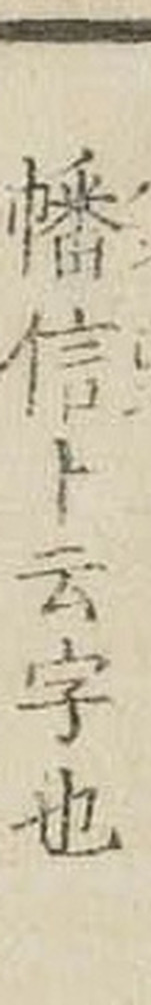幡信ト云字ナリ
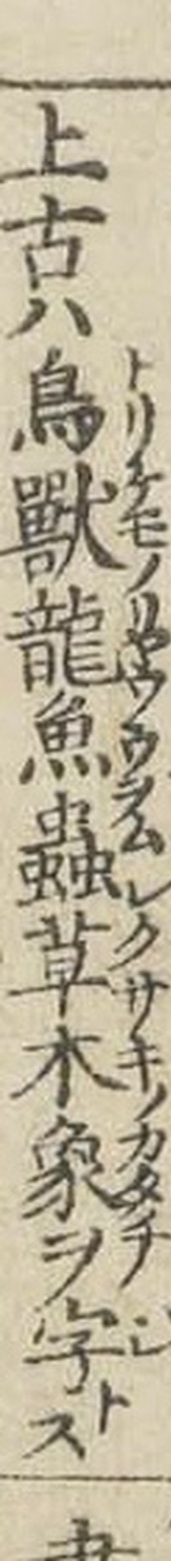上古ハ鳥獣竜魚虫草木象ヲ字トス

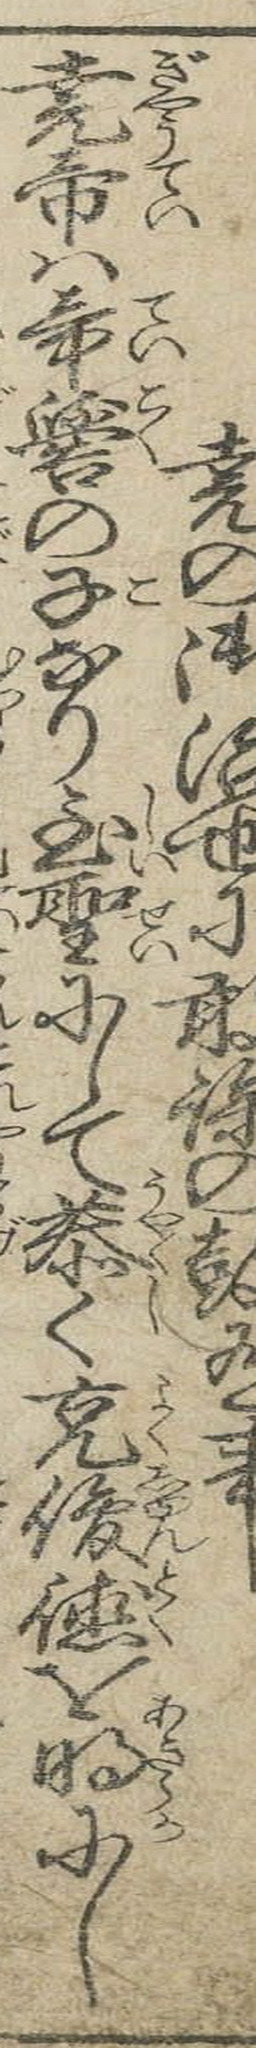尭帝は帝嚳の子なり至聖にして恭く克俊徳を明にし
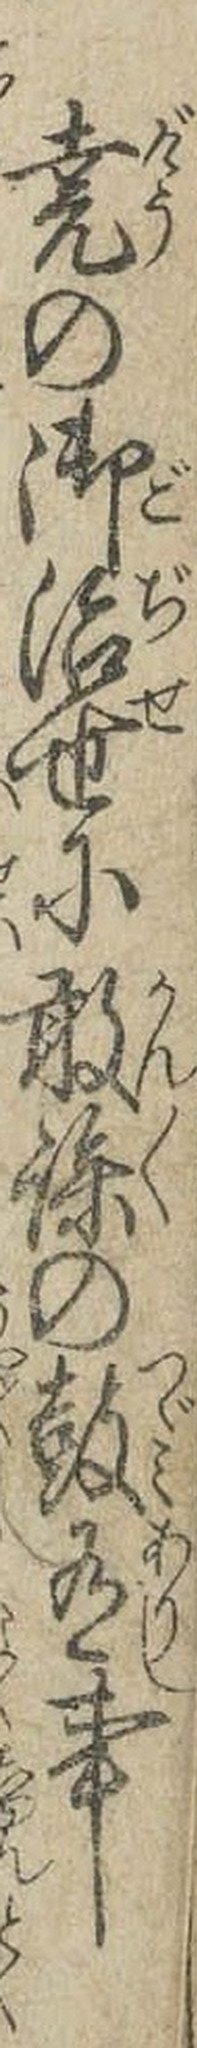尭の御治世に敢諫の鼓有事
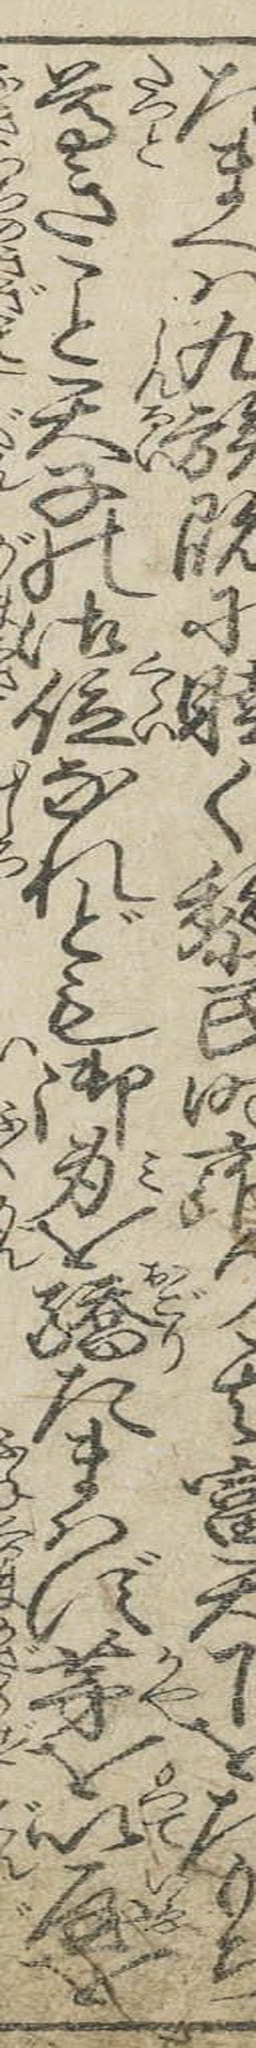尊きこと天子の御位なれども御身を驕たまはず茅を以屋を
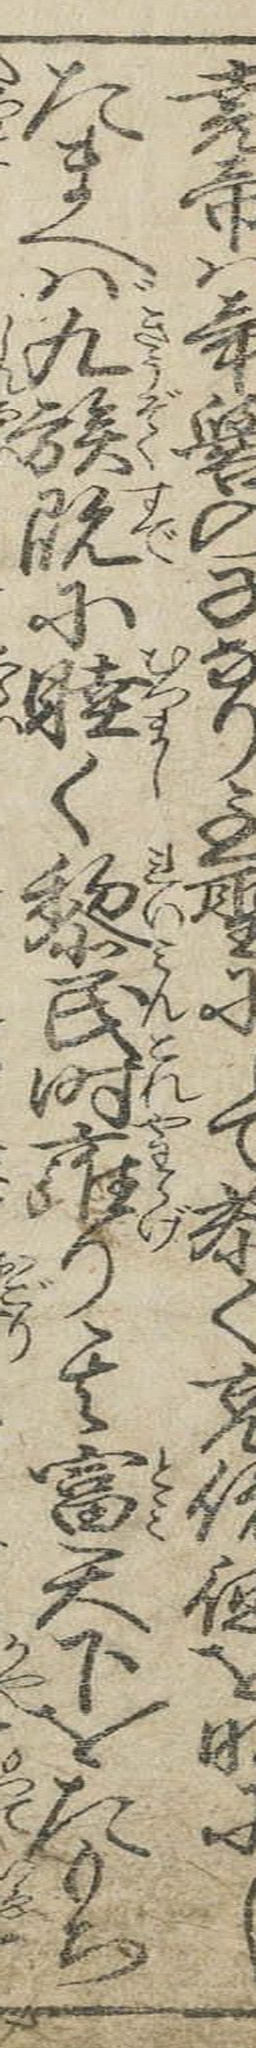たまへば九族既に睦く黎民時雍り其富天下をたもち
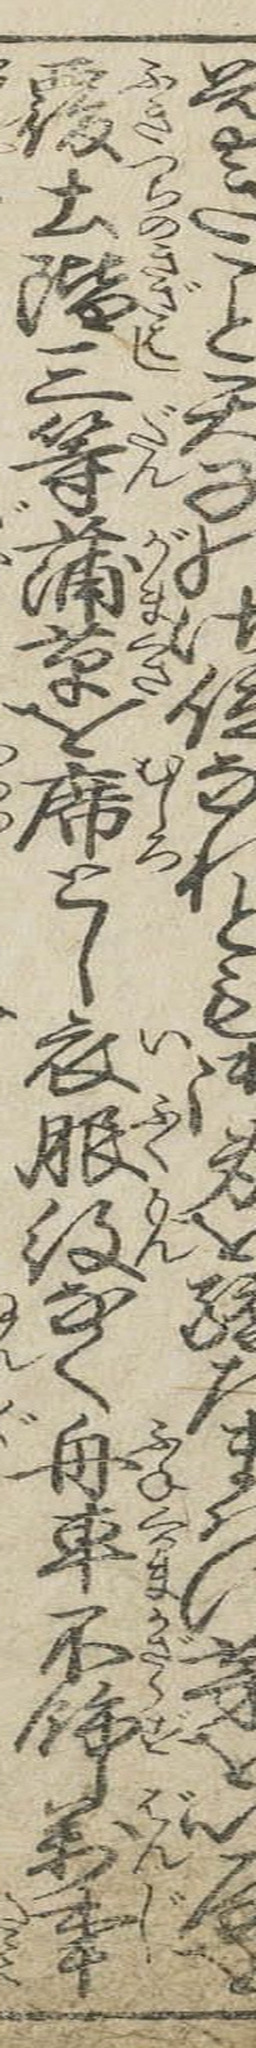覆土階三等蒲草を席とし衣服紋なく舟車不飾万事
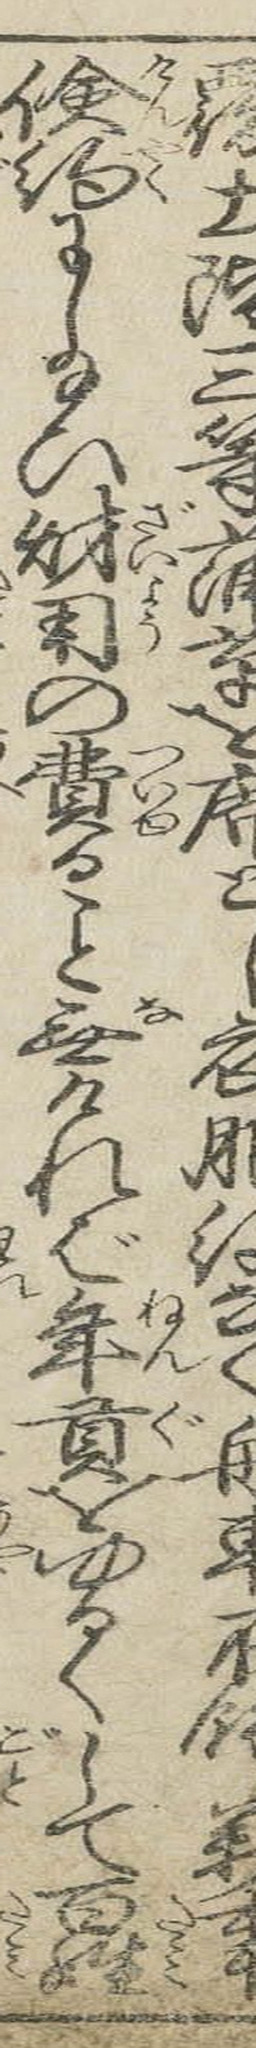倹約にし給ひ財用の費ること無ければ年貢をゆるくして百姓
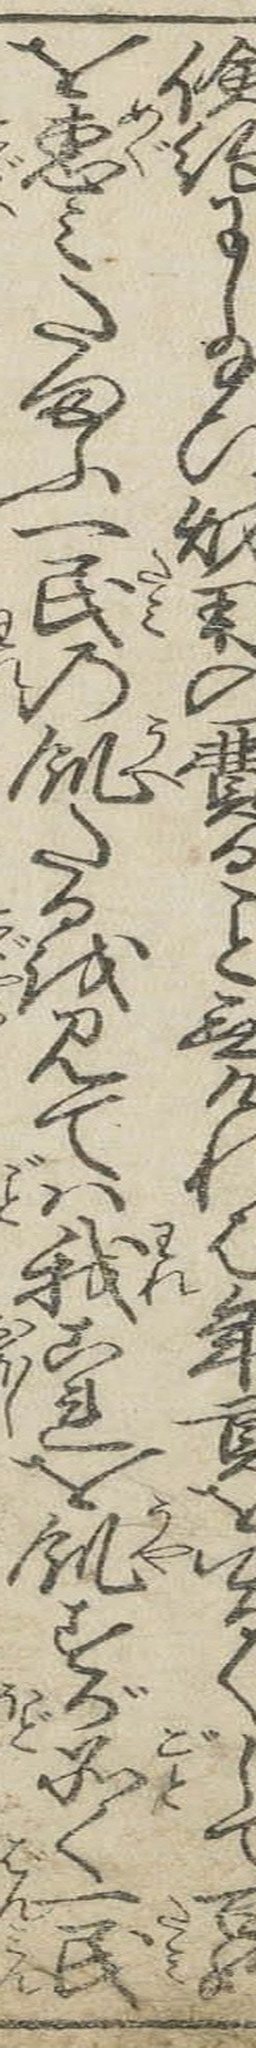を恵みたまふ一民の飢たるを見ては我これを飢すが如く一民
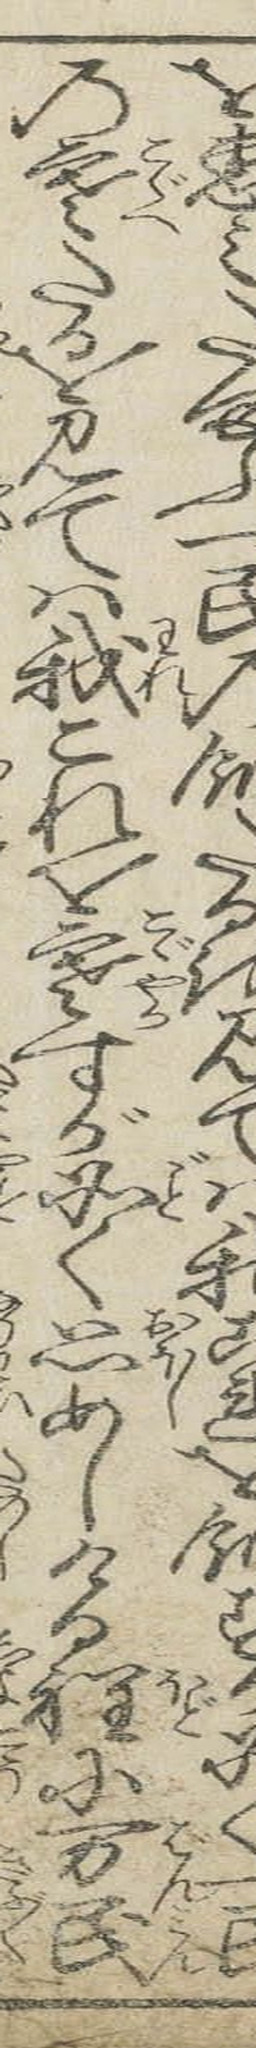の寒たるを見ては我これを寒すが如く思めしける程に万民
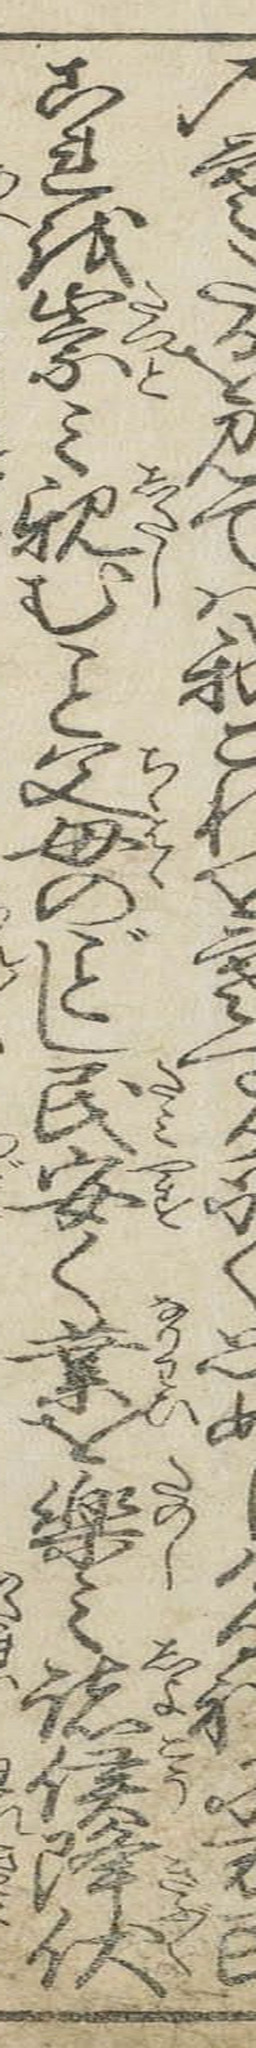これを崇み親むこと父母のごとし民安く業を楽み諸侯降伏
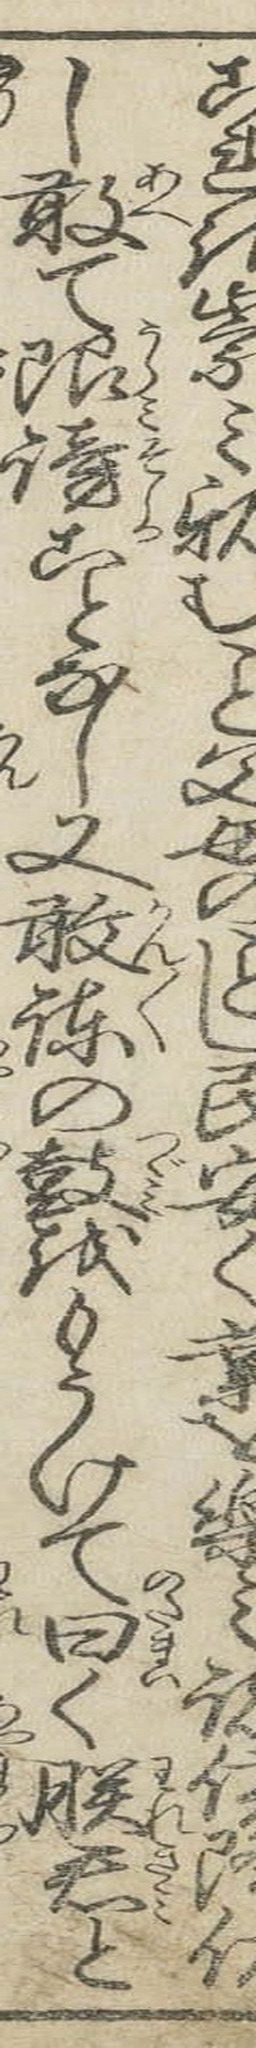し敢て恨謗ことなし又敢諫の鼓をもうけて曰く朕君と
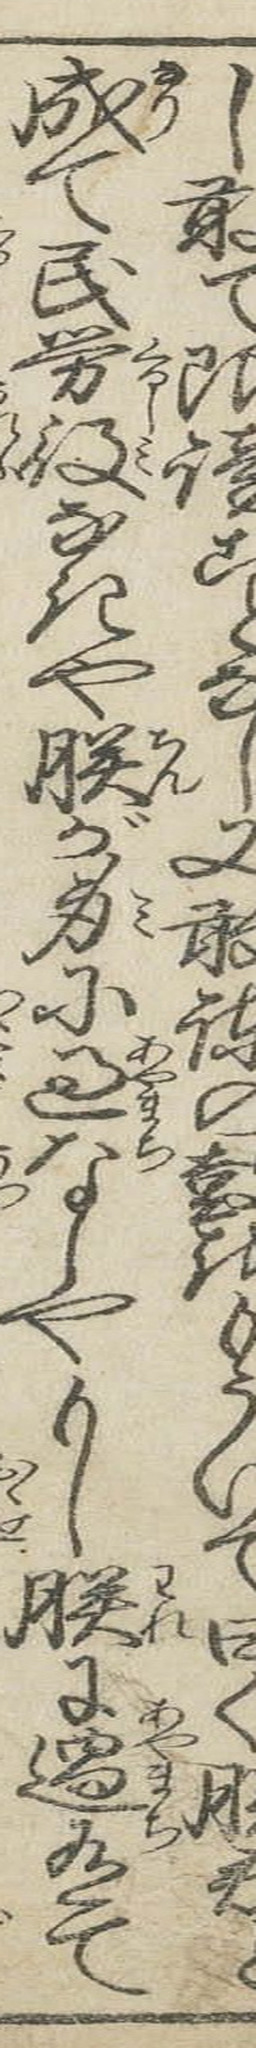成て民労役なきや朕が身に過なしやもし朕に過有て
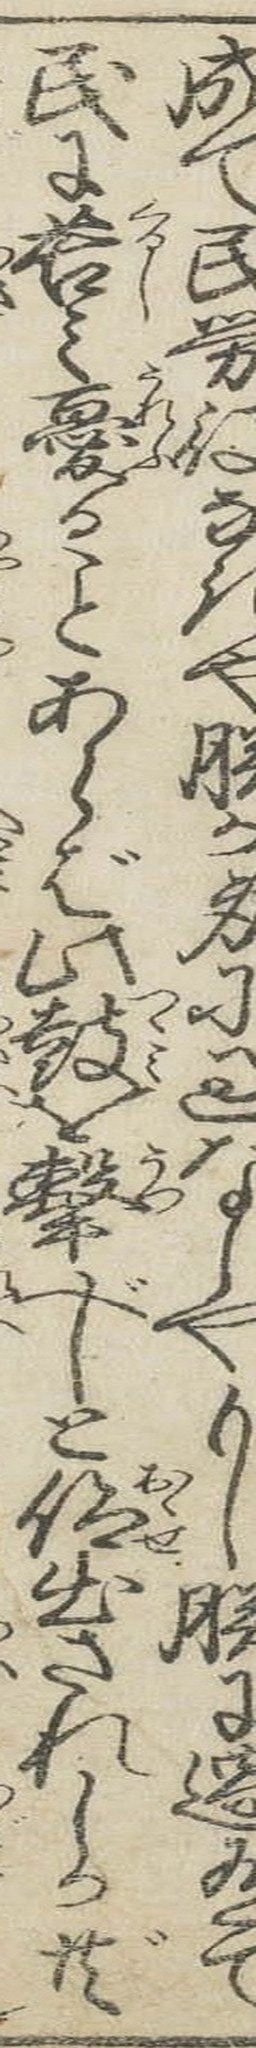民に苦み憂ることあらば此鼓を撃べしと仰出されしか〝共
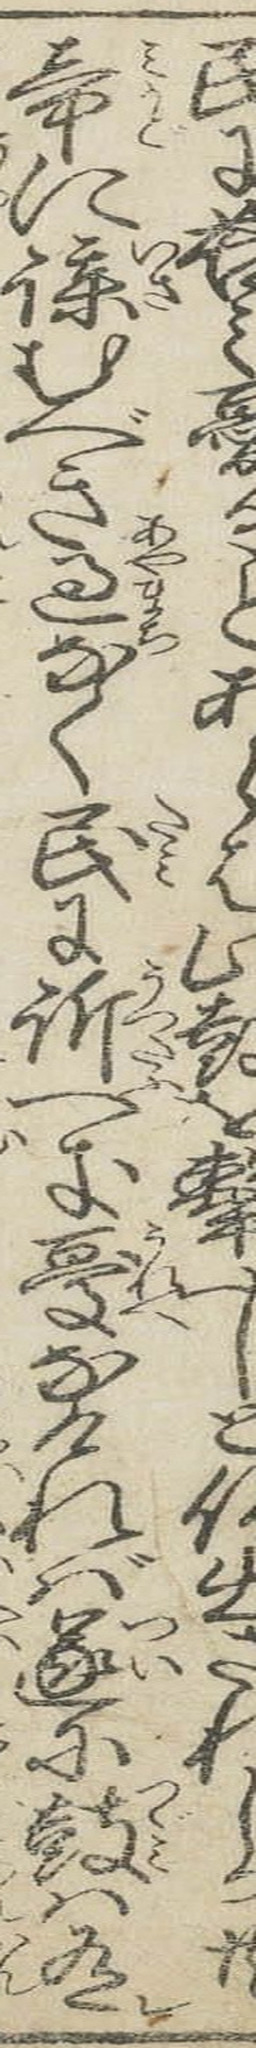帝に諫むべき過なく民に訴へき憂なければ遂に鼓は有
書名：絵本写宝袋 9巻 4之巻
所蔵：東京学芸大学教育コンテンツアーカイブ
